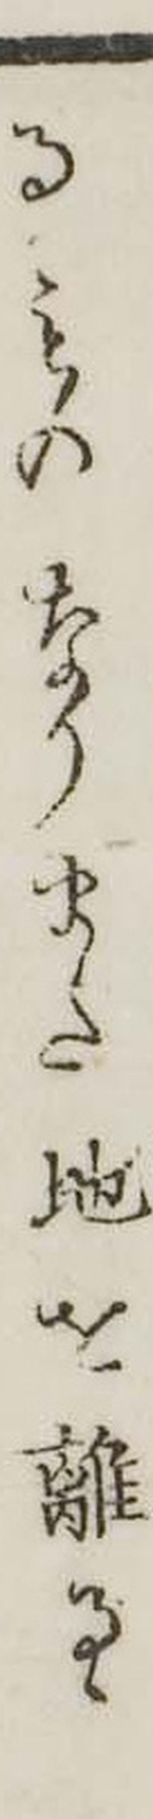るものなりまた地を離るゝ
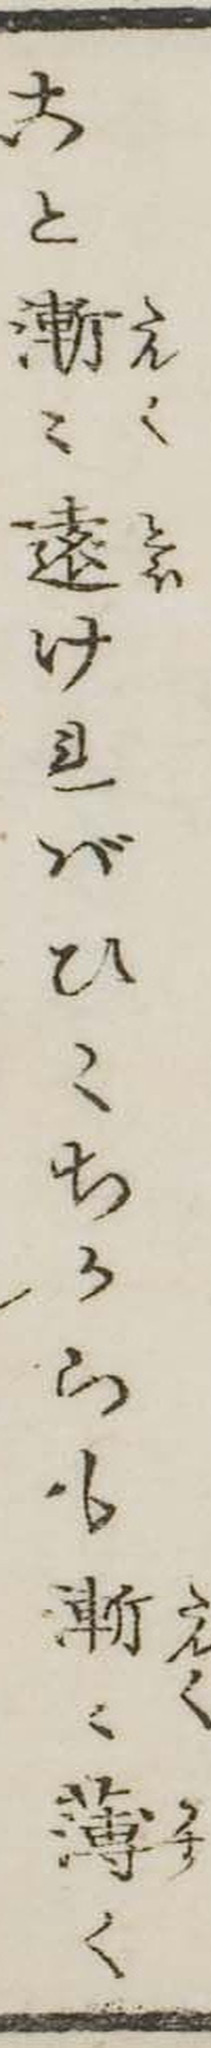こと漸〻遠ければひくちからも漸〻薄く
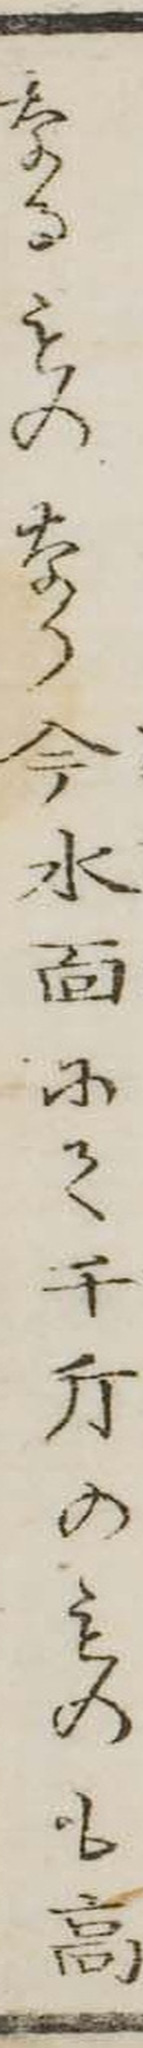なるものなり今水靣にて千斤のものも高

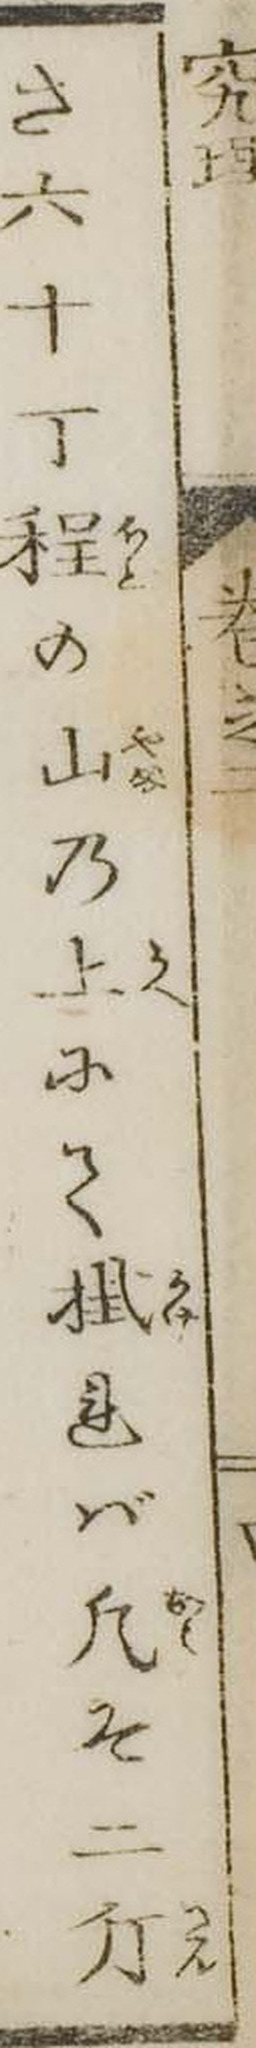き六十丁程の山の上にて掛れば凢そ二斤
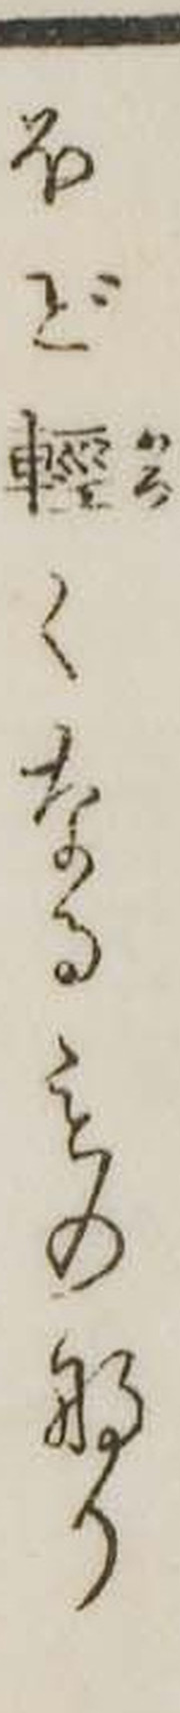ほど輕くなるものなり
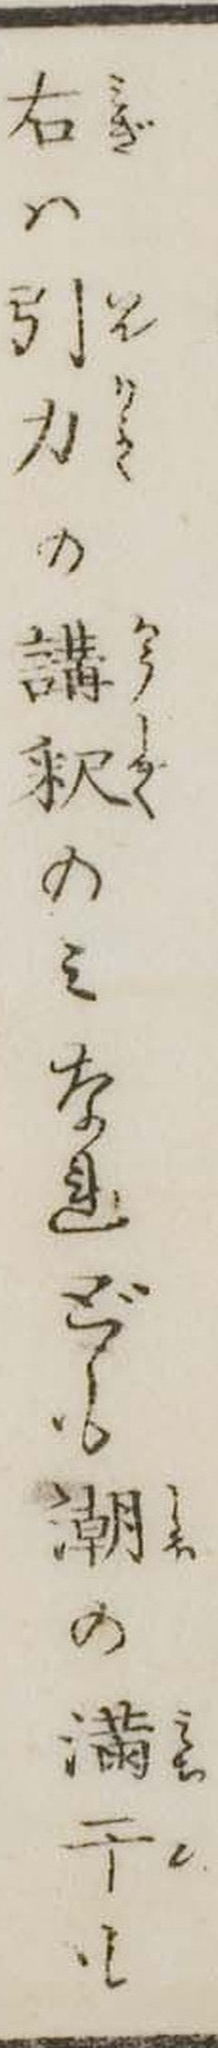右は引力の講釈のみなれども潮の満干も
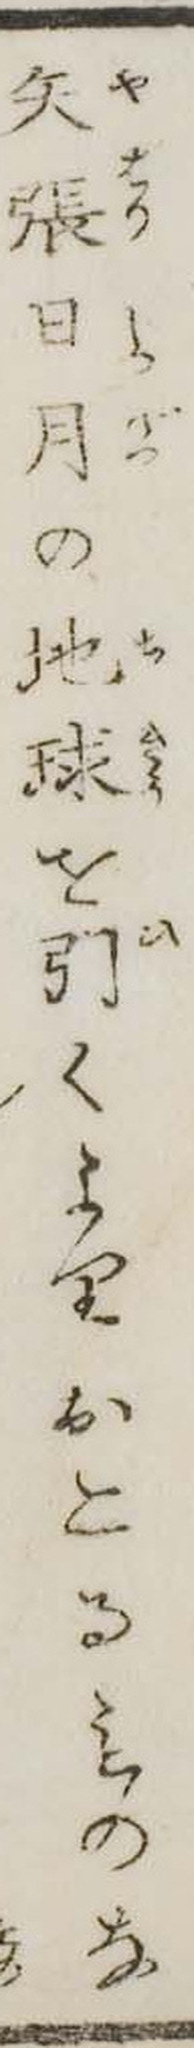矢張日月の地球を引くよりおこるものな
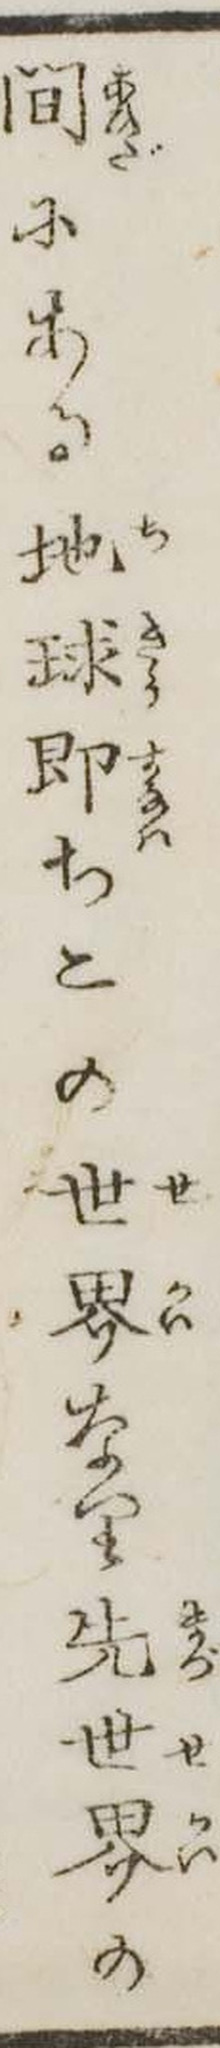間にある地球即ちこの世界なり先世界の
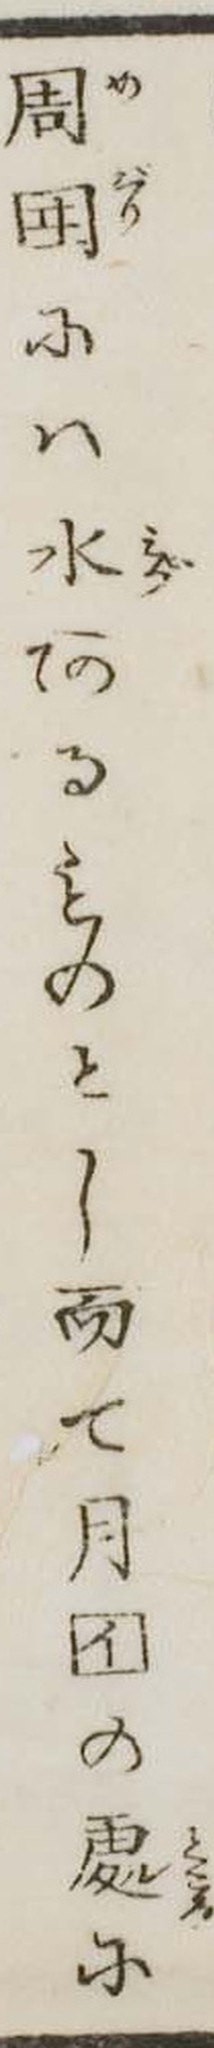周囲には水あるものとし而て月[イ]の處に
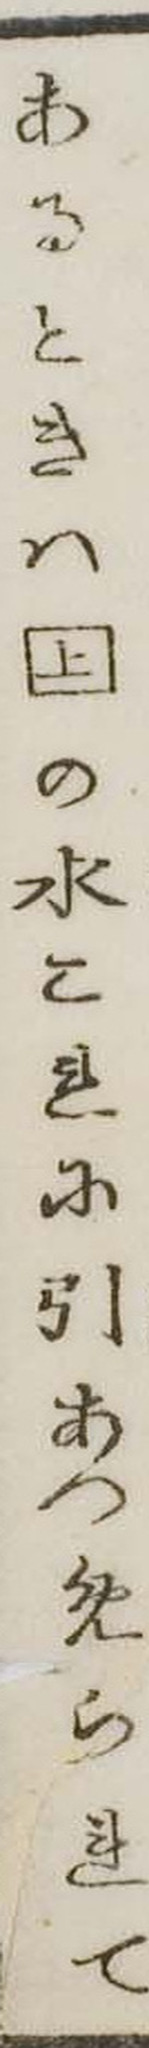あるときは[上]の水これに引あつめられて
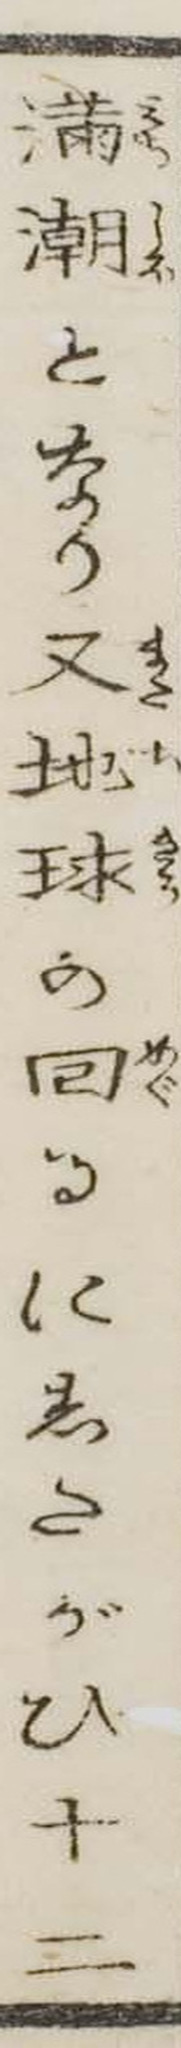満潮となり又地球の囘るにしたがひ十二
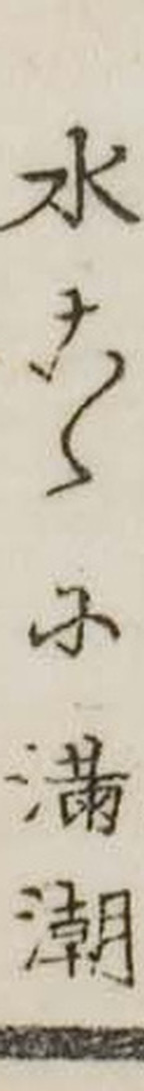水こゝに満潮
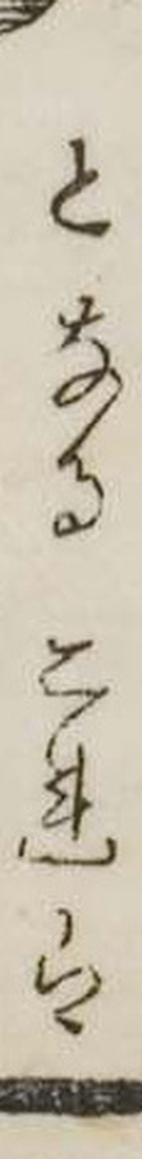となるこれは
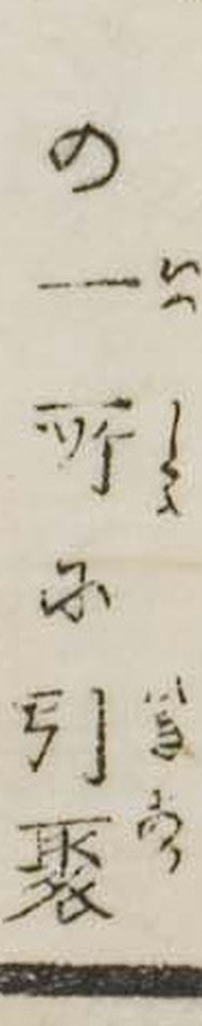の一所に引聚
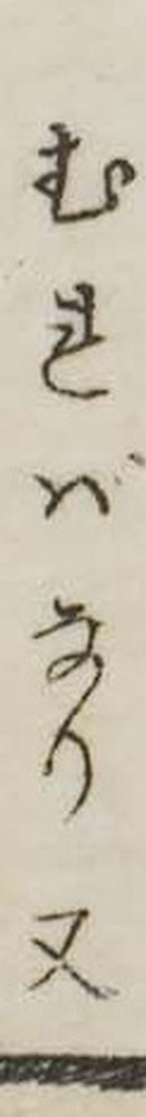むればなり又

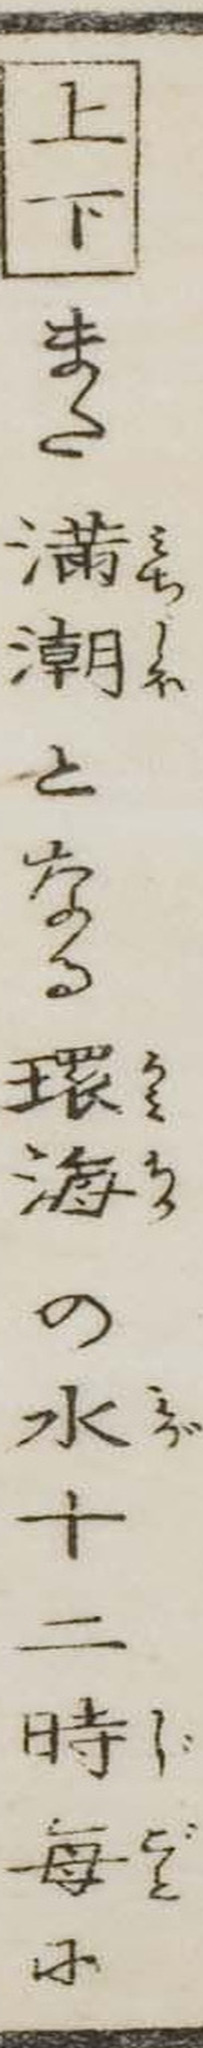[上下]また満潮となる環海の水十二時毎に
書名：究理知慧の勧 : 訓蒙画入 巻之2
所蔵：東京学芸大学附属図書館
